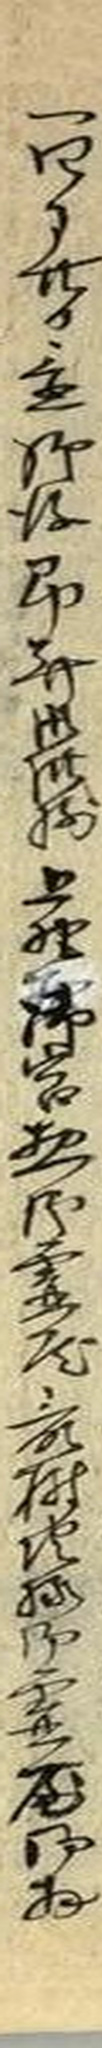一四月廿日置御後即刻御供揃上野御宮惣御霊屋最樹院様御霊廟御拝
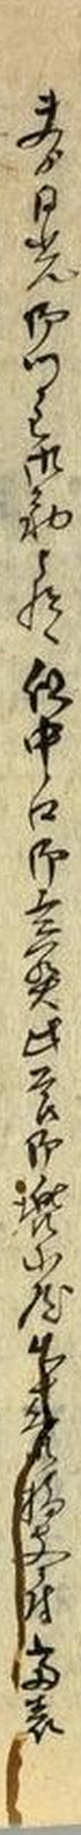夫ゟ日光御門主御勤被遊候但中ノ口御玄関此節御兜小屋出来御指支ニ付当表
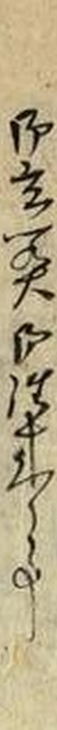御玄関御往来之事
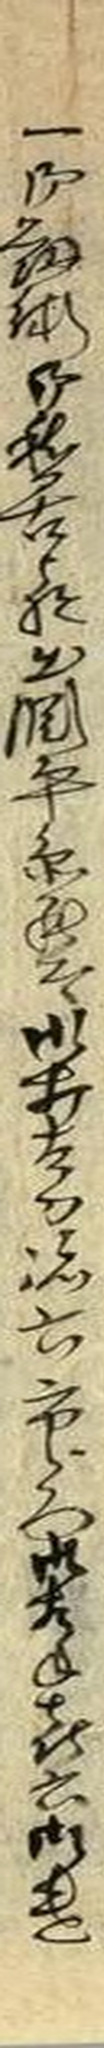一御剣術御稽古被遊出淵平兵衛罷出候御打太刀弥六市郎右衛門御相手喜六御遣
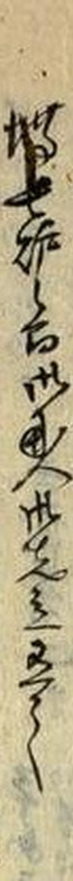場長炉之間御用人御先立有之
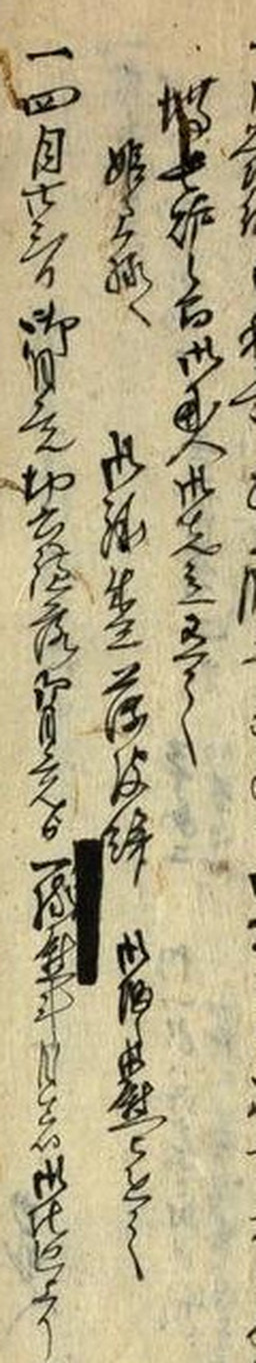姫君様へ御鉢盛薄皮餅御側御慰被進之
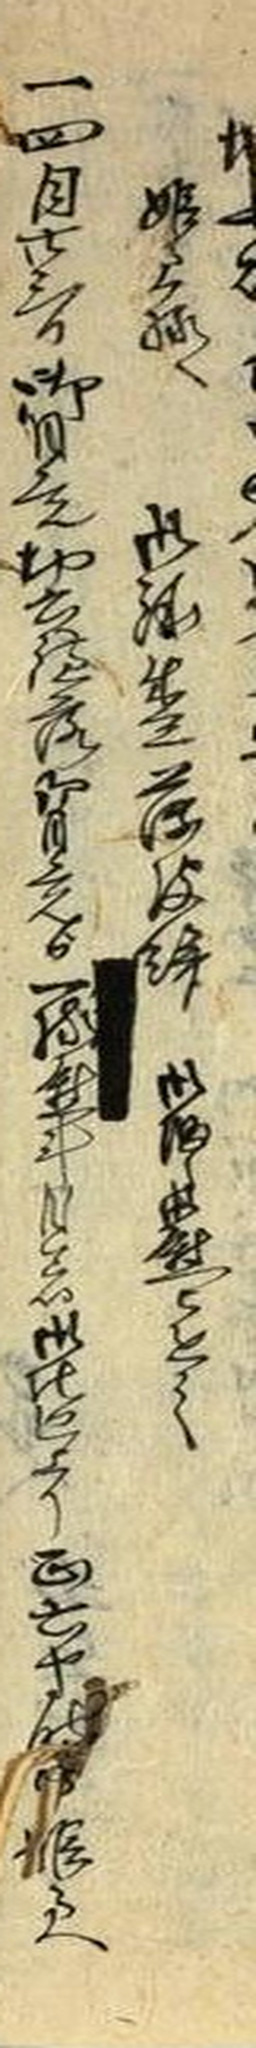一四月廿三日御目覚切六鎌落御目覚ゟ一統熨斗目着御仕廻上り正六半時御姫君
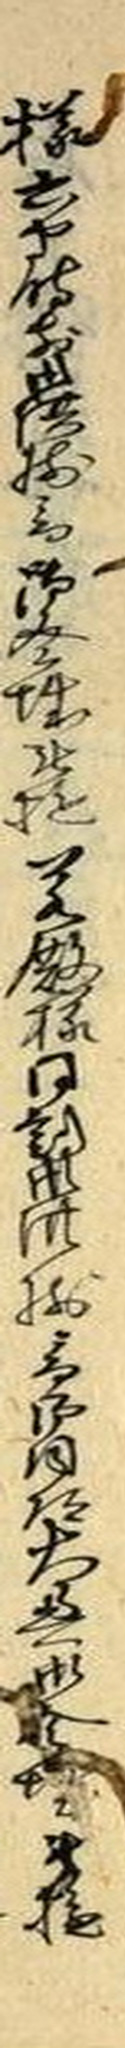様六半時前御供揃ニ而御登城被遊若殿様同刻御供揃ニ而御同道大奥御登城被遊
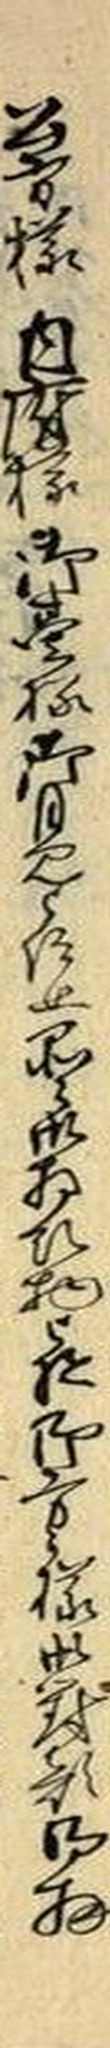公方様内府様御台様御目見被仰上品々御拝領物被遊御方々様御対顔御拝
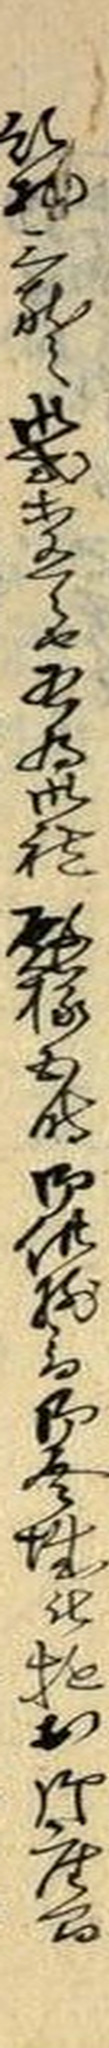領物三献之御式等有之由右為御礼殿様五時御供揃ニ而御登城被遊於御座之間
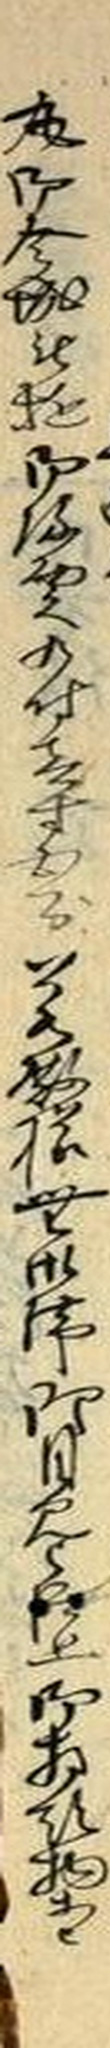丸御登城被遊御帰殿九時壱寸五分若殿様無御滞御目見被仰上御拝領物等被
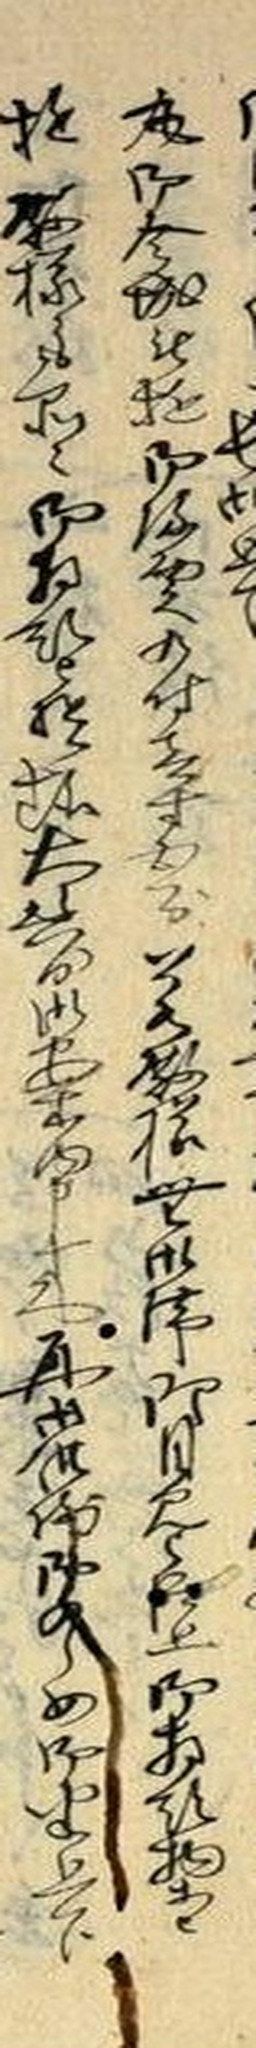遊殿様ニも品々御拝領被遊候趣大奥ゟ御案内申来再御供揃御のしめ御半上下
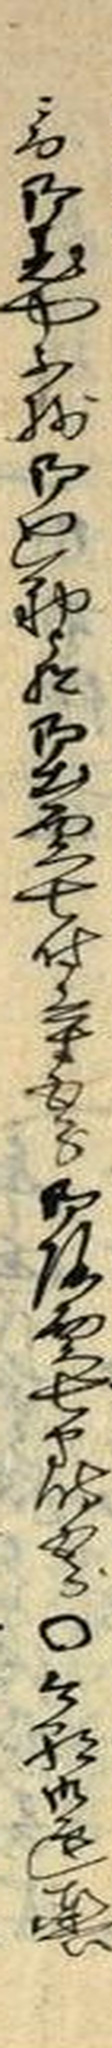ニ而御老中不残御廻勤被遊御出殿七時壱寸五分御帰殿七半時五分○今朝御迎輿
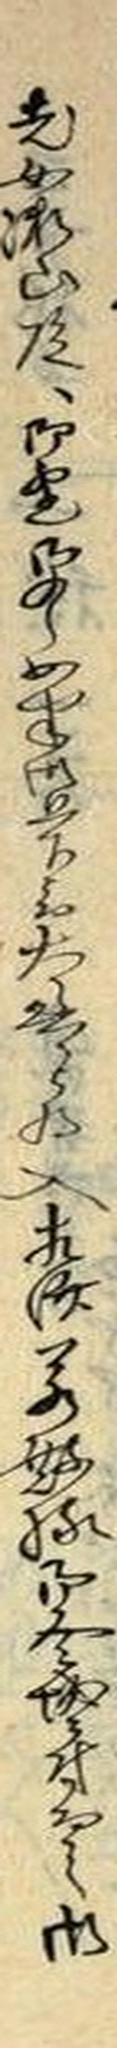老女瀬山殿へ御逢御のしめ半御上下ニ而大奥被為入相済若殿様御登城ニ付而之御
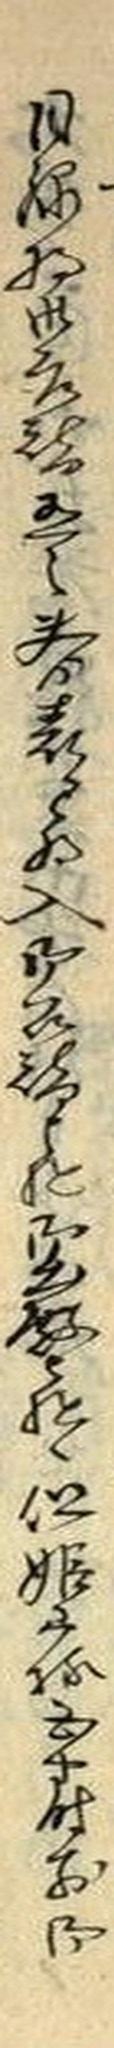目録為御取替有之夫ゟ表被為入御召替被遊御出殿被遊候但姫君様五半時前御
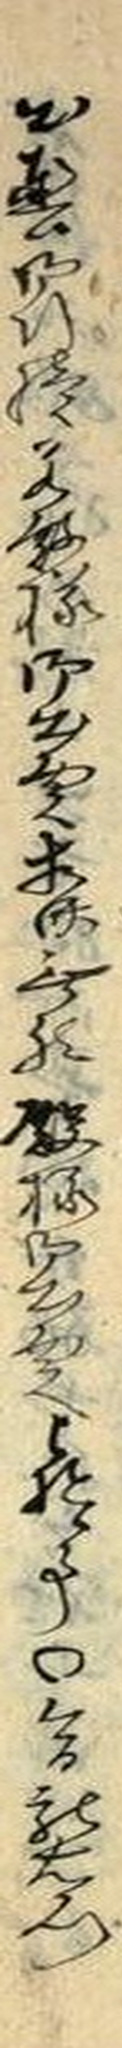出輿御引続若殿様御出殿相済無程殿様御出殿被遊候事○今日新右衛門
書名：少傅日録抄（斉承付側向頭取日記、在府）
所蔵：福井県文書館 Fukui Prefectural Archives
